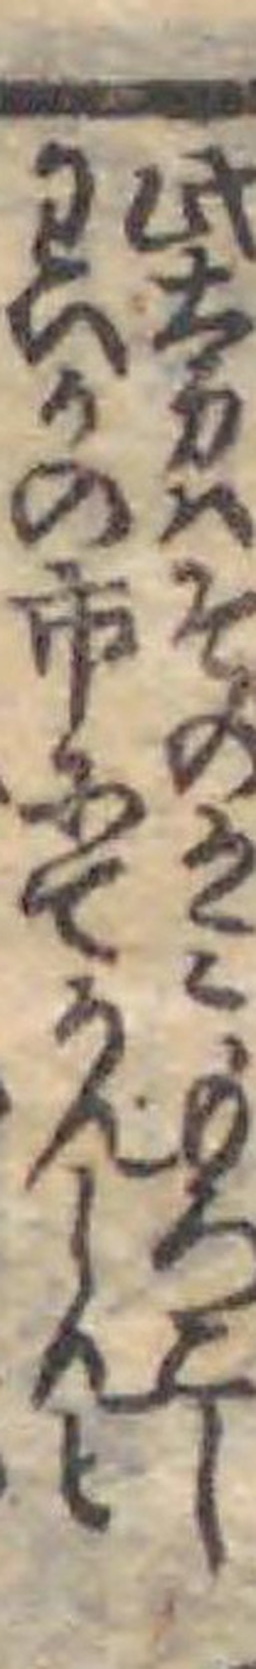わいかの市にてかんしんと
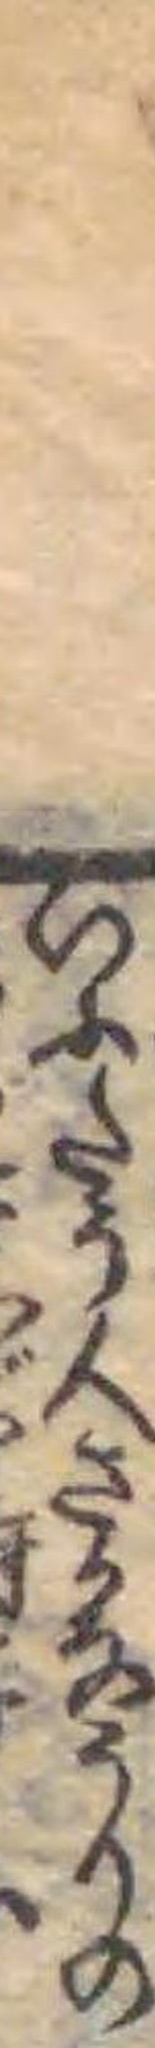いふたう人さかなうりの
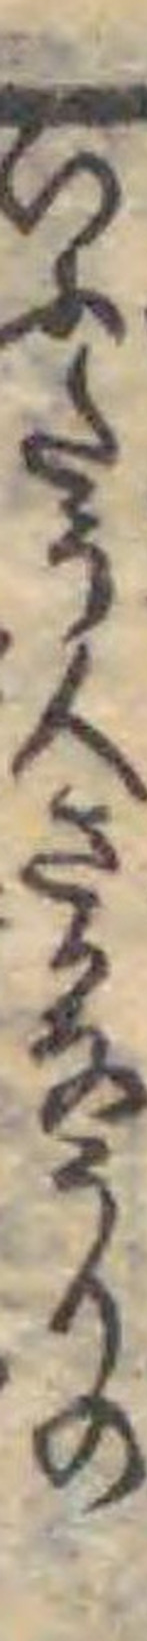いふたう人さかなうりの
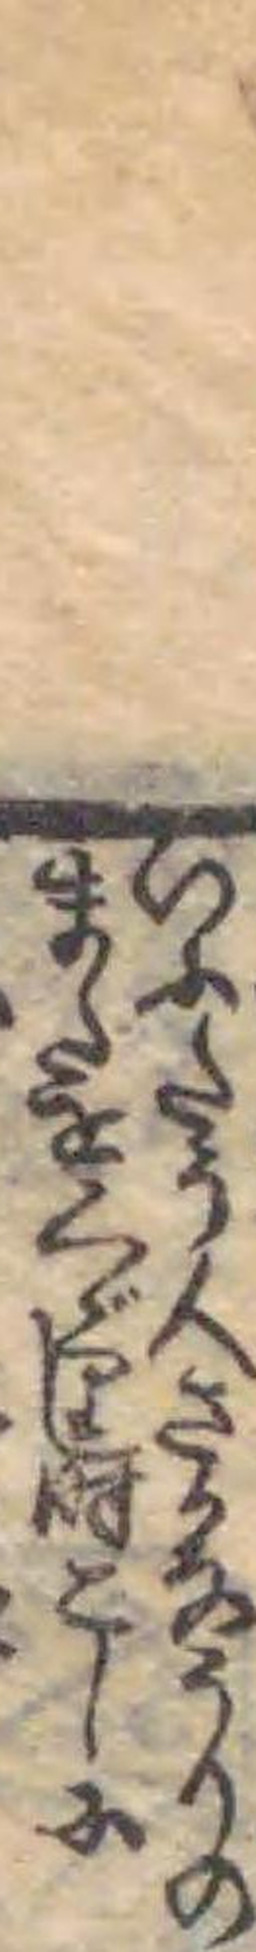またをくぐりし時こしに
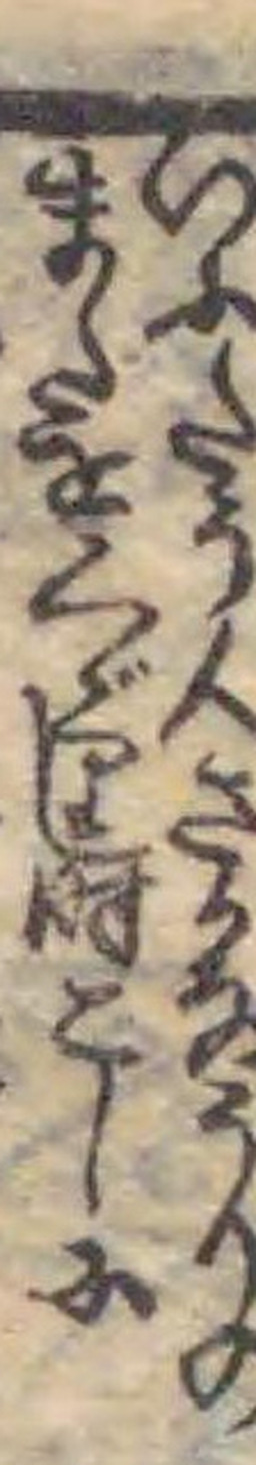またをくぐりし時こしに
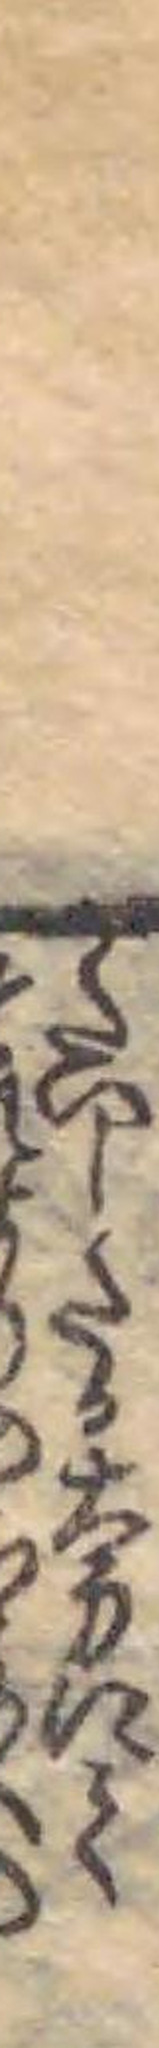たいしたる太刀にて
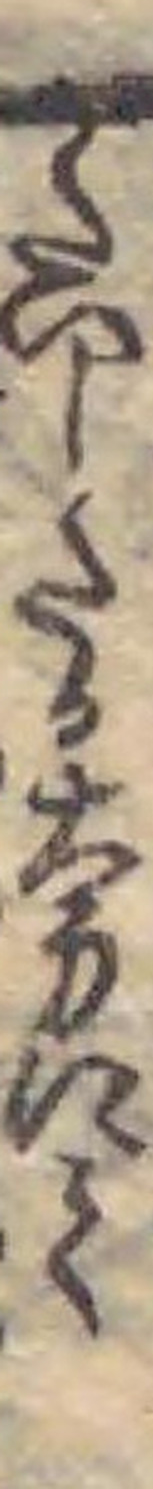たいしたる太刀にて
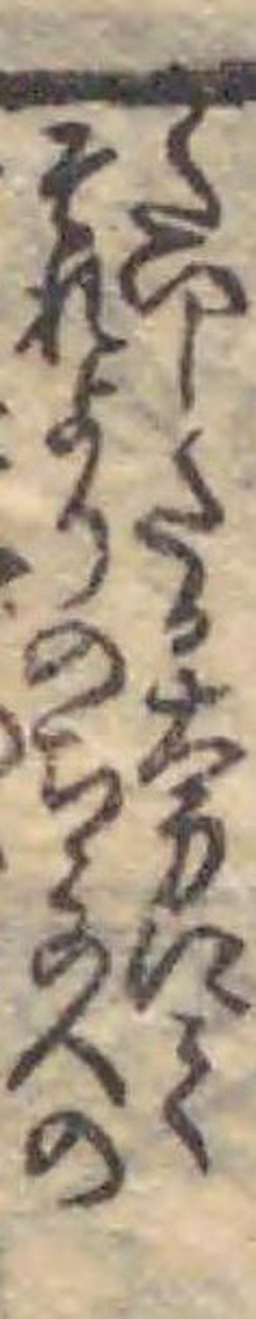それよりのちこの人の
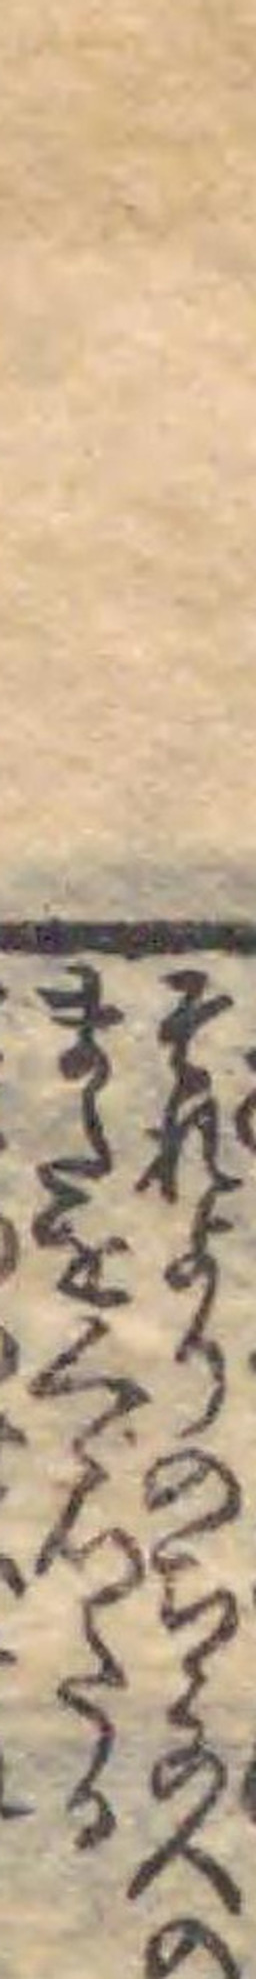またをくゞつたる
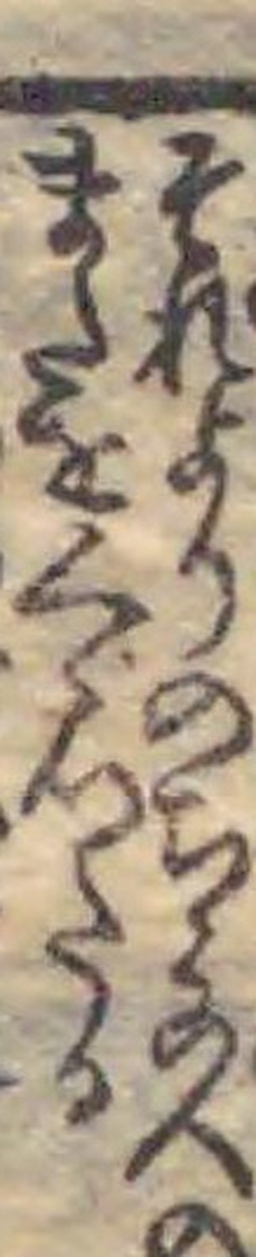またをくゞつたる
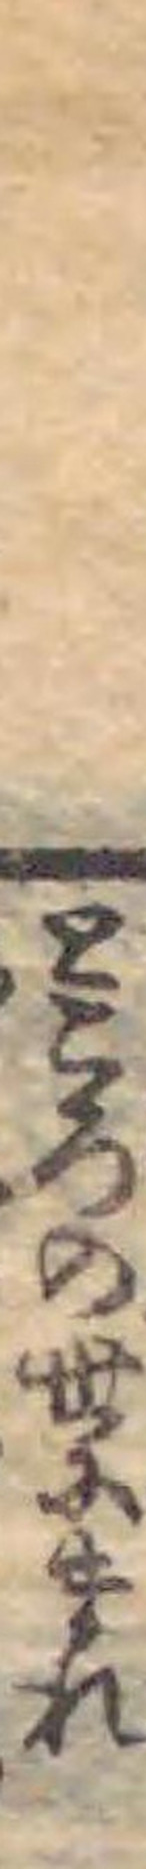ところの世にまれ
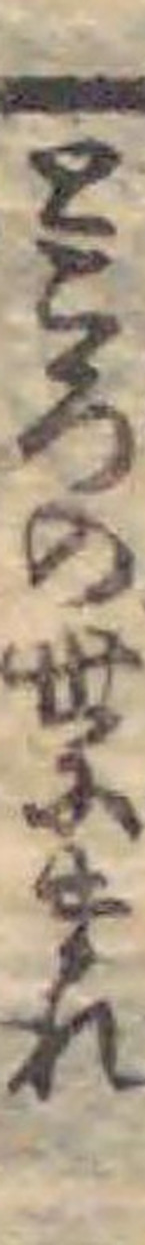ところの世にまれ
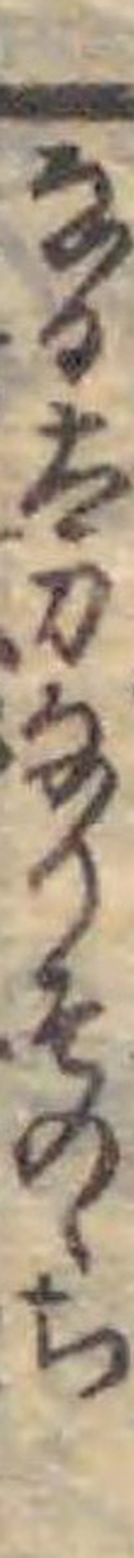なる太刀なりそのゝち
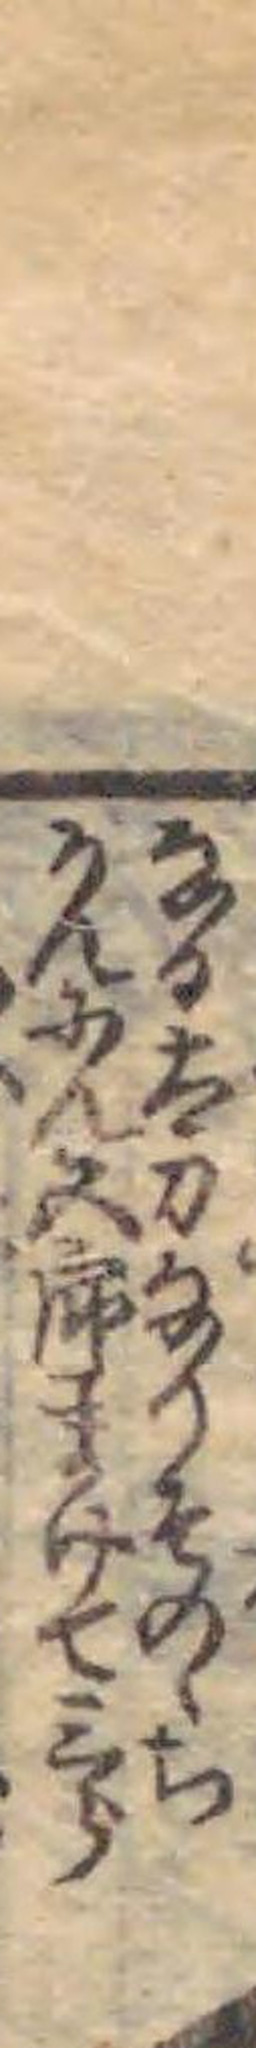かんにん五郎まけて三郎
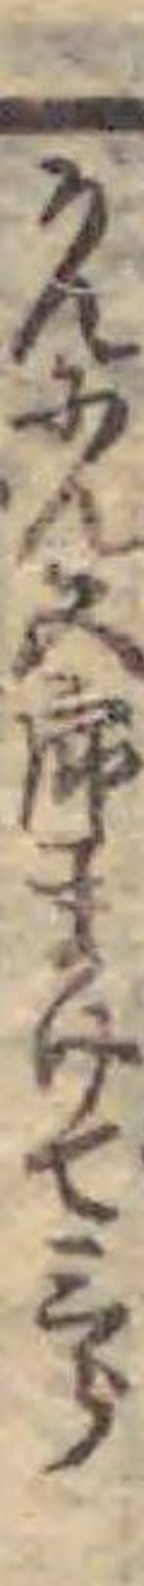かんにん五郎まけて三郎
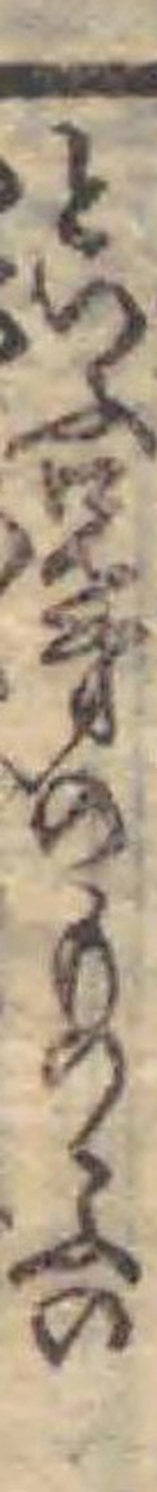といふ鏡台のものゝふの
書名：身体開帳略縁起 : 3巻
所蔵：国立国会図書館 National Diet Library, JAPAN
